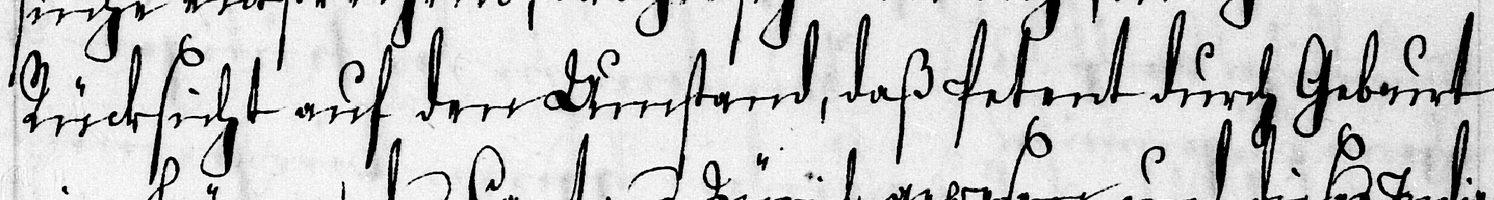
Rücksicht auf den Umstand, daß Petent durch Geburt
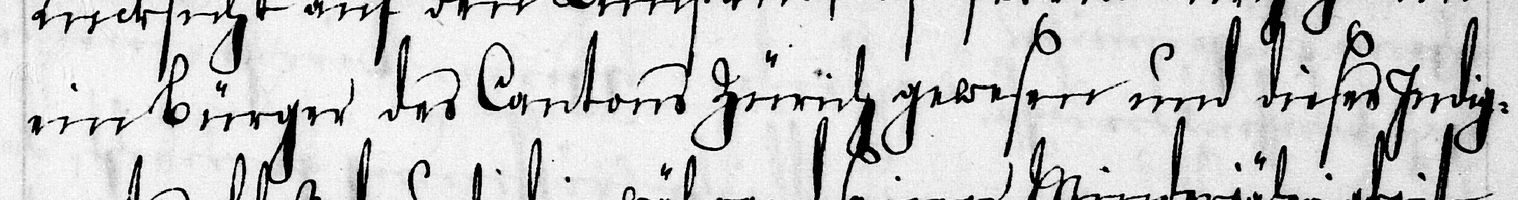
ein Bürger des Cantons Zürich gewesen und dieses Indig¬
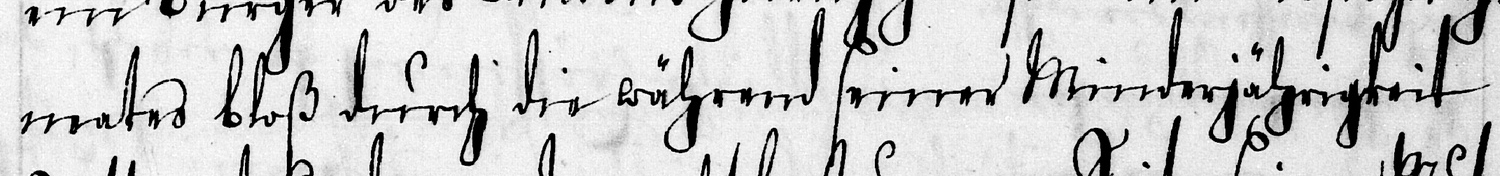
neates bloß durch die während seiner Minderjährigkeit
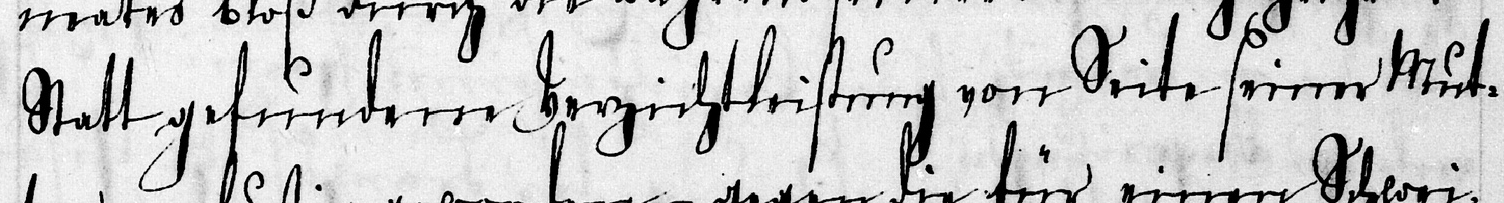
Statt gefundene Verzichtleistung von Seite seiner Mut¬
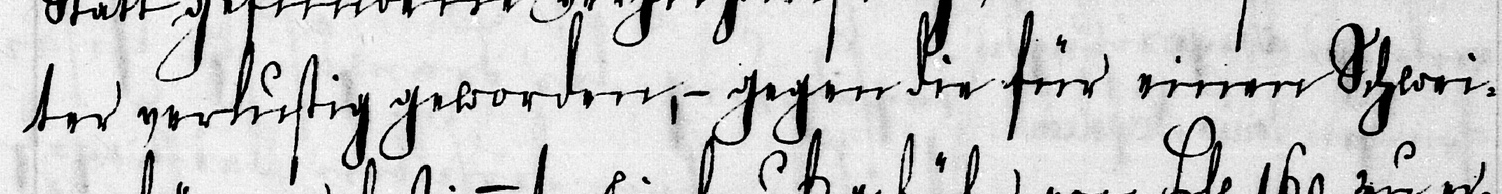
ter verlustig geworden, – gegen die für einen Schwei¬
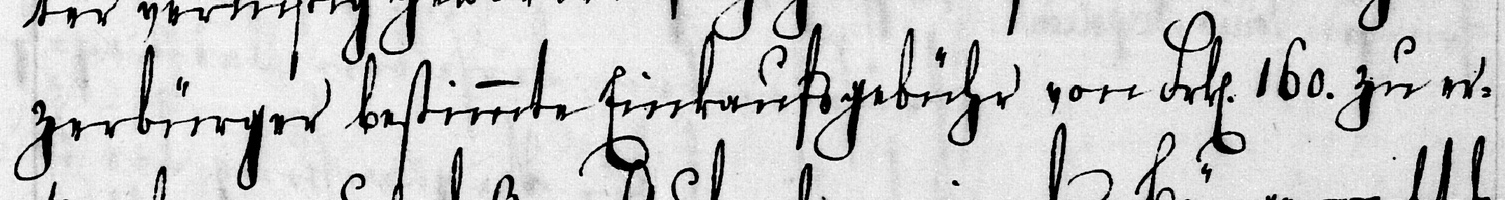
zerbürger bestimmte Einkaufsgebühr von Frk[en]. 160. zu er¬
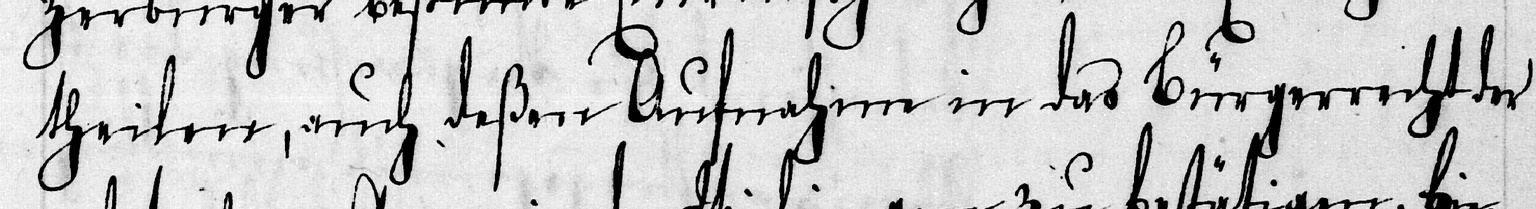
theilen, auch deßen Aufnahme in das Bürgerrecht der
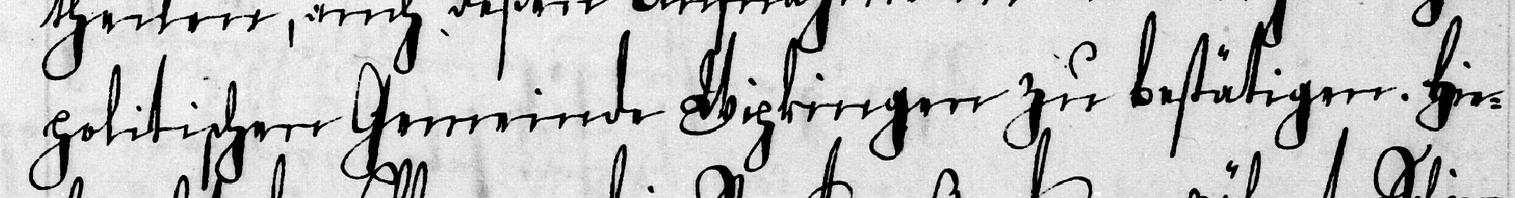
politischen Gemeinde Wipkingen zu bestätigen. Hie¬
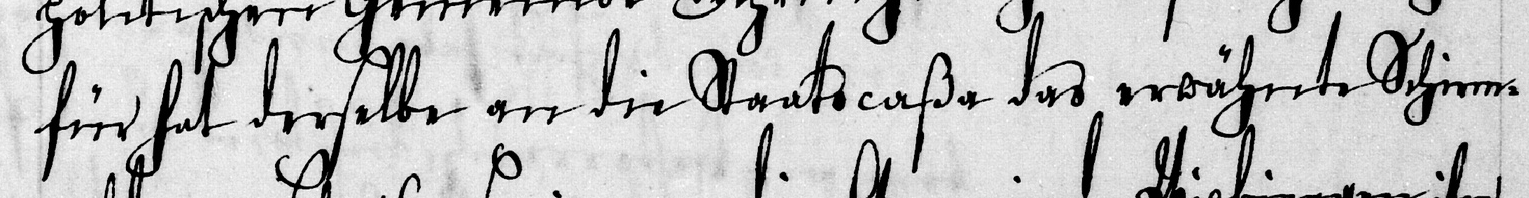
für hat derselbe an die Staatscaßa das erwähnte Schirm¬
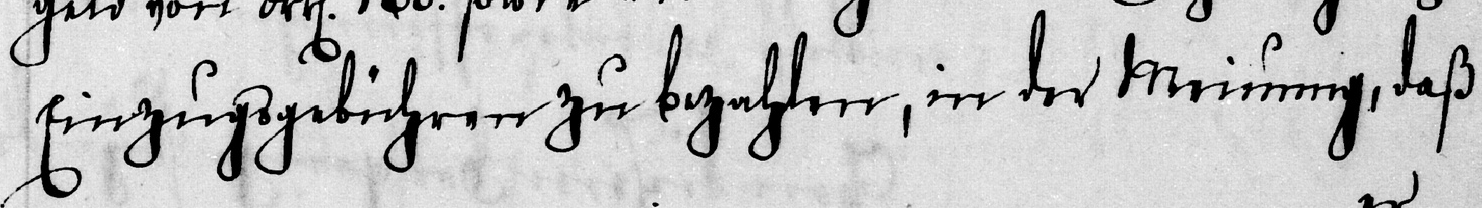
Einzugsgebühren zu bezahlen, in der Meinung, daß
